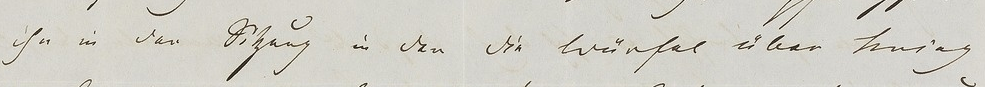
ihn in der Sitzung in der die Würfel über Krieg
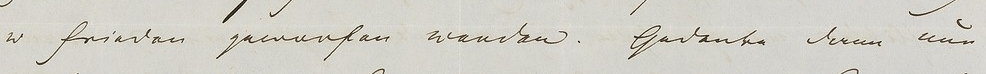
& Frieden geworfen werden. Gedenke dann nur
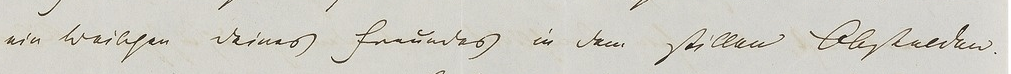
ein Weilchen deines Freundes in dem stillen Obstalden.
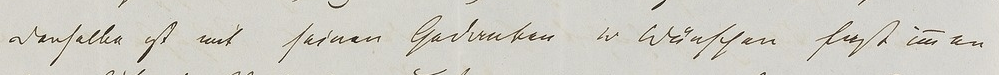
Derselbe ist mit seinen Gedanken & Wünschen fast immer
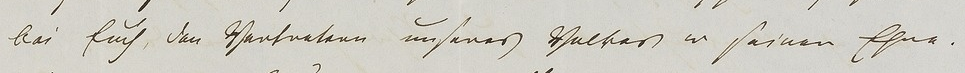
bei Euch, den Vertretern unseres Volkes & seiner Ehre.
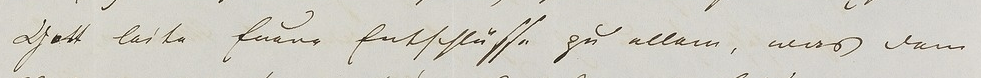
Gott leite Euere Entschlüsse zu allem, was dem
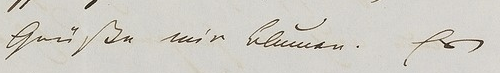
Grüße mir Blumer. Es
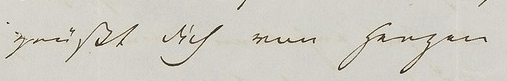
grüßt dich von Herzen
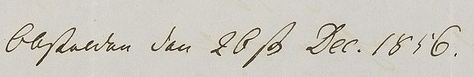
Obstalden den 26sten Dec. 1856.
